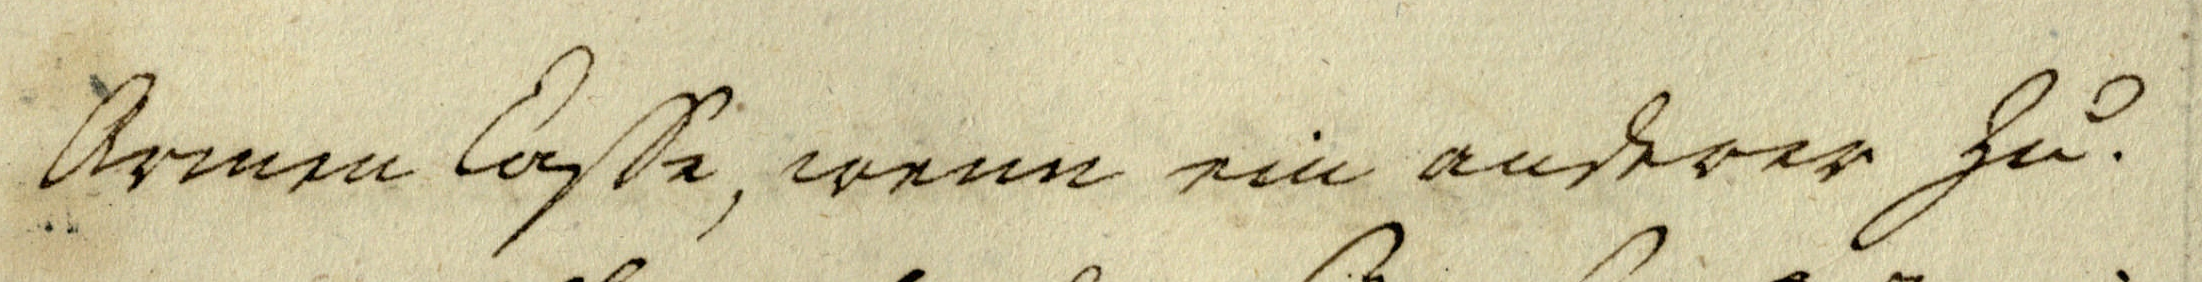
Armen Casse, wenn ein anderer Zu¬
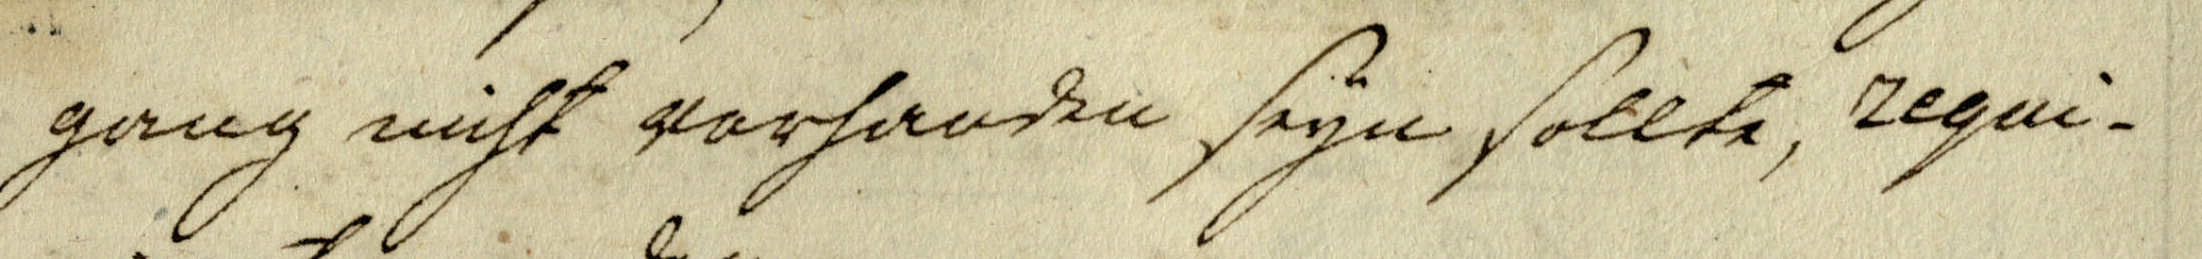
gang nicht vorhanden seÿn sollte, requi¬
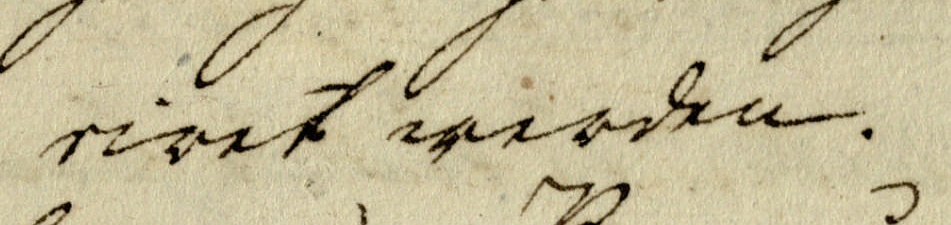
riret werden.
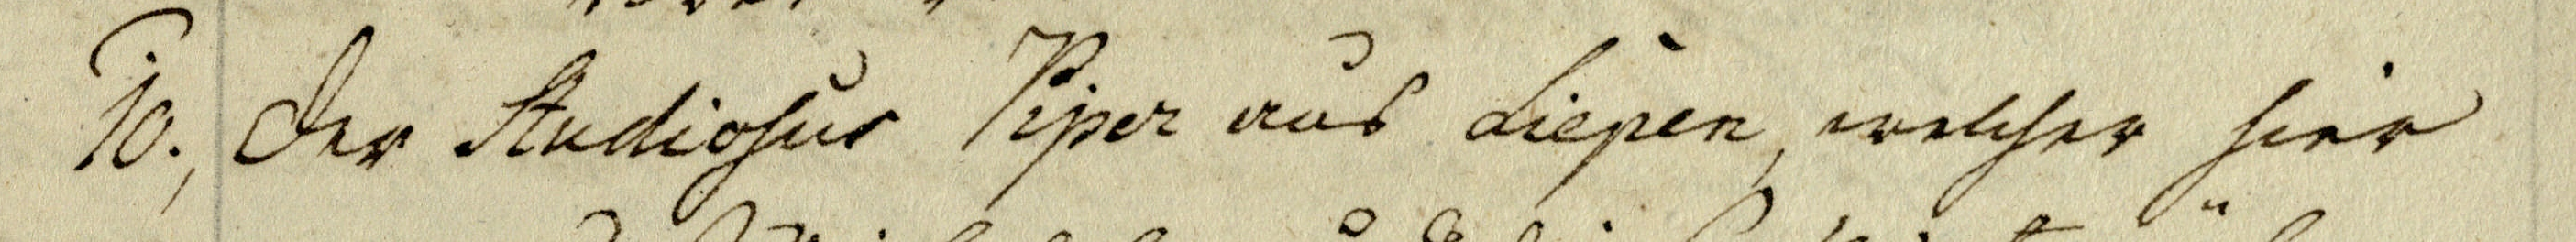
10. Der Studiosus Piper aus Liepen, welcher hier
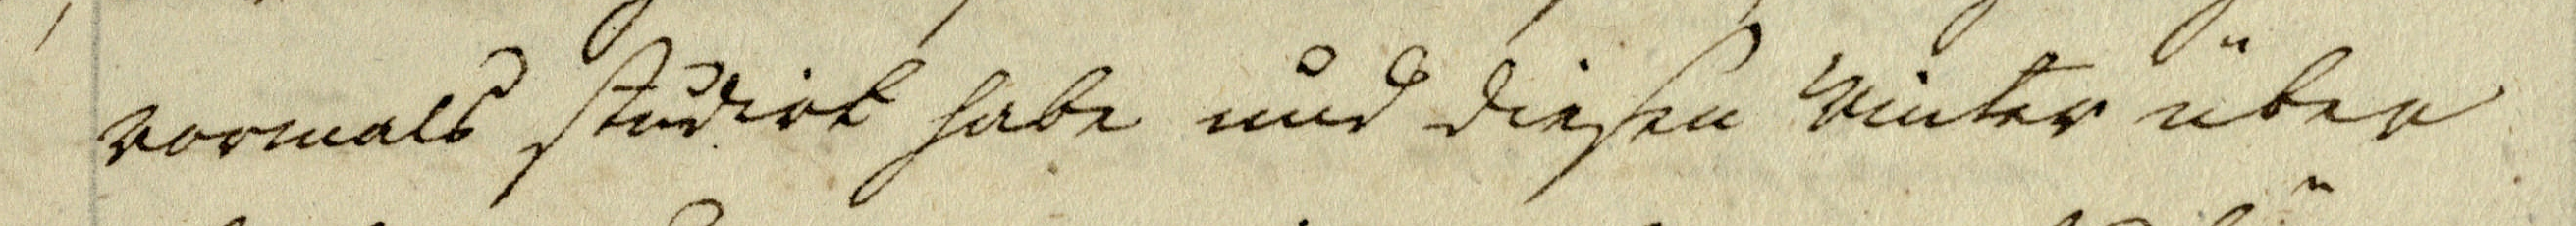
vormals studirt habe und diesen Winter über
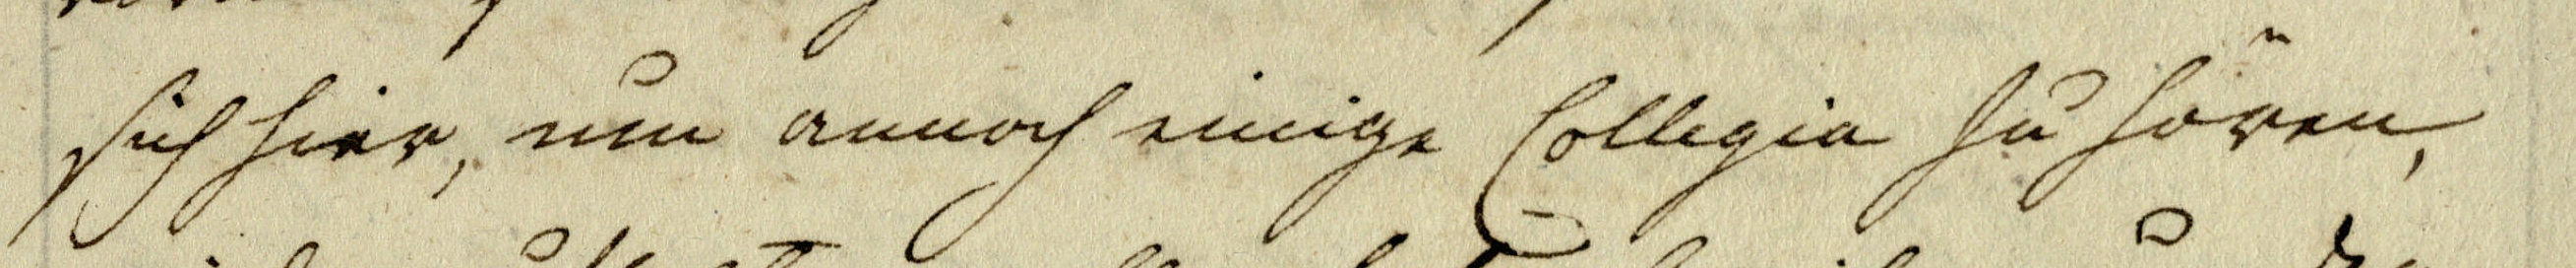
sich hier, um annoch einige Collegio zu hören,
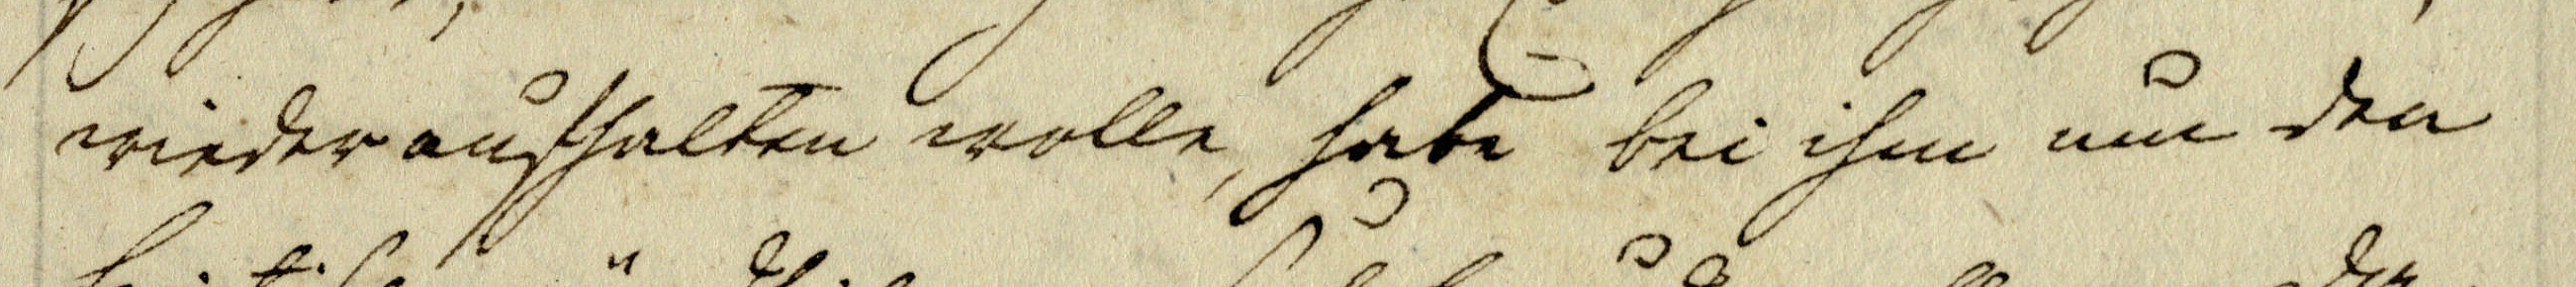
wieder aufhalten wolle, habe bei ihm um den
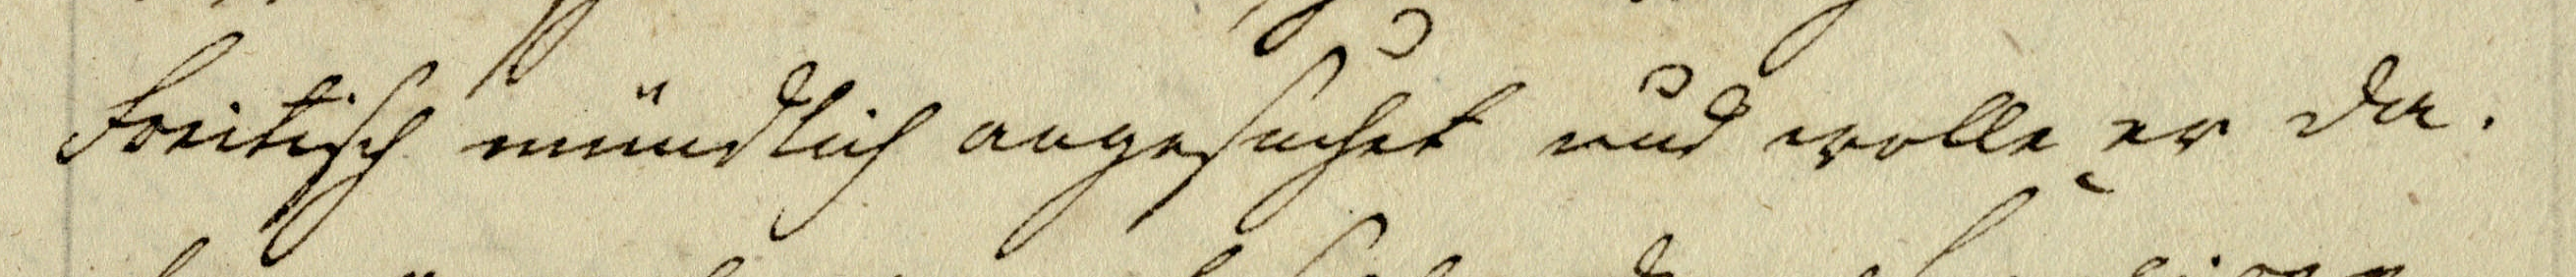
Freitisch mündlich angesuchet und wolle er da¬
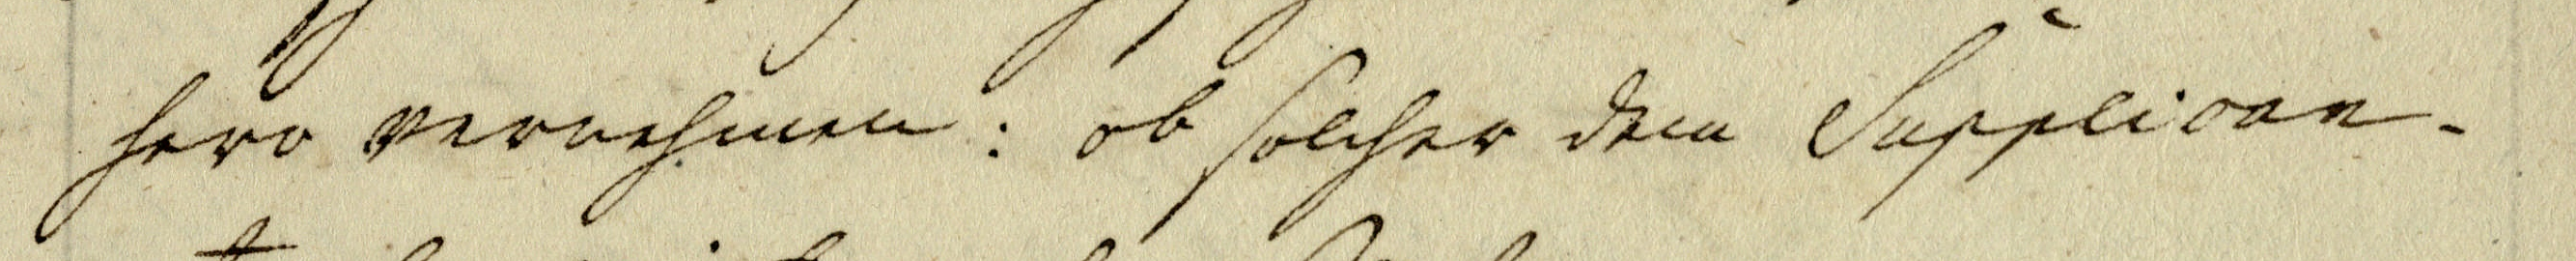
hero vernehmen : ob solcher dem Supplican¬
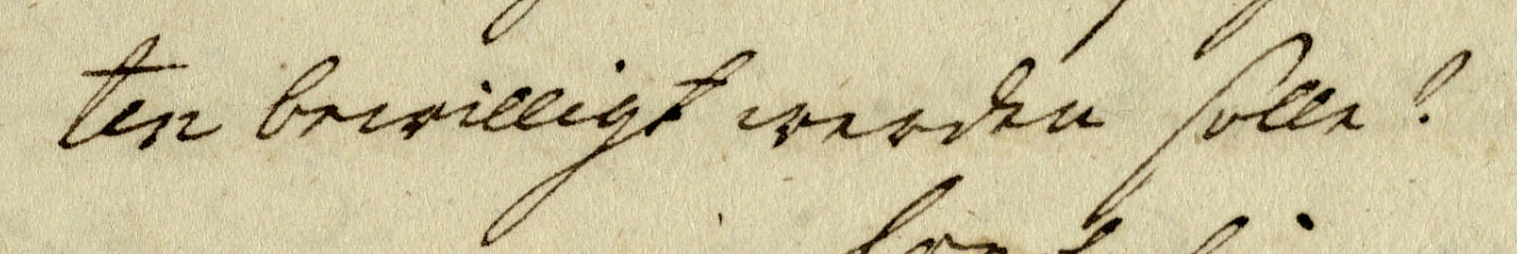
ten bewilligt werden solle?
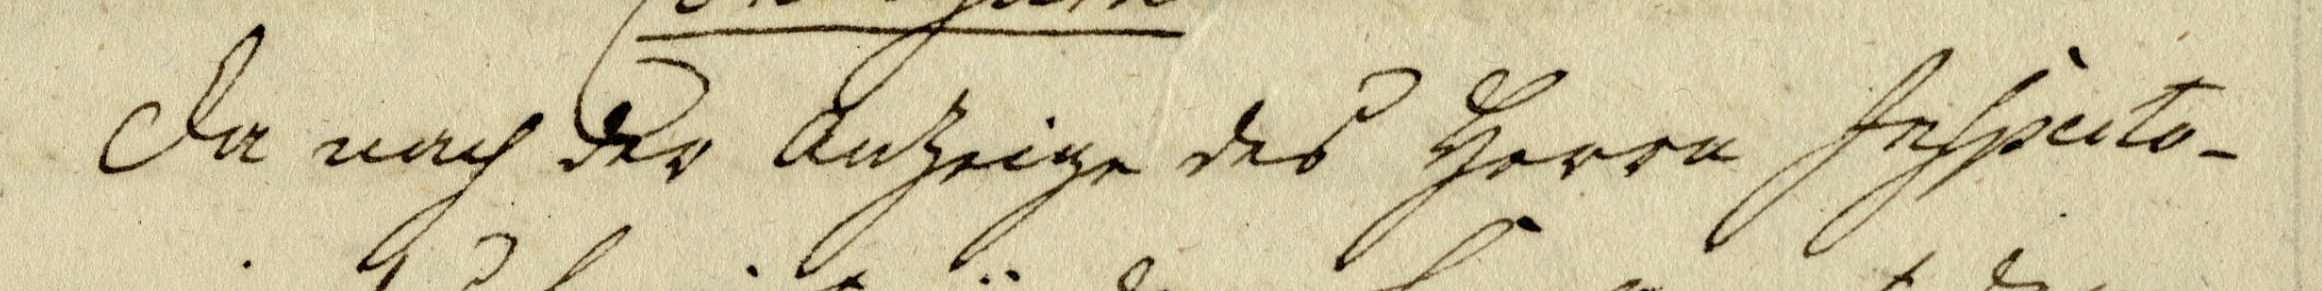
Da nach der Anzeige des Herrn Inspecto¬
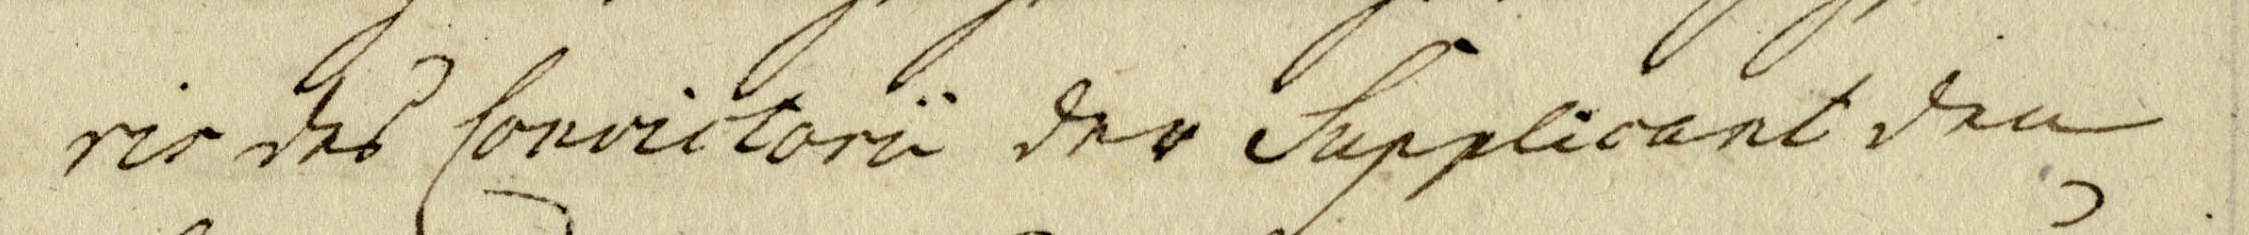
ris des Convictorii der Supplicant den
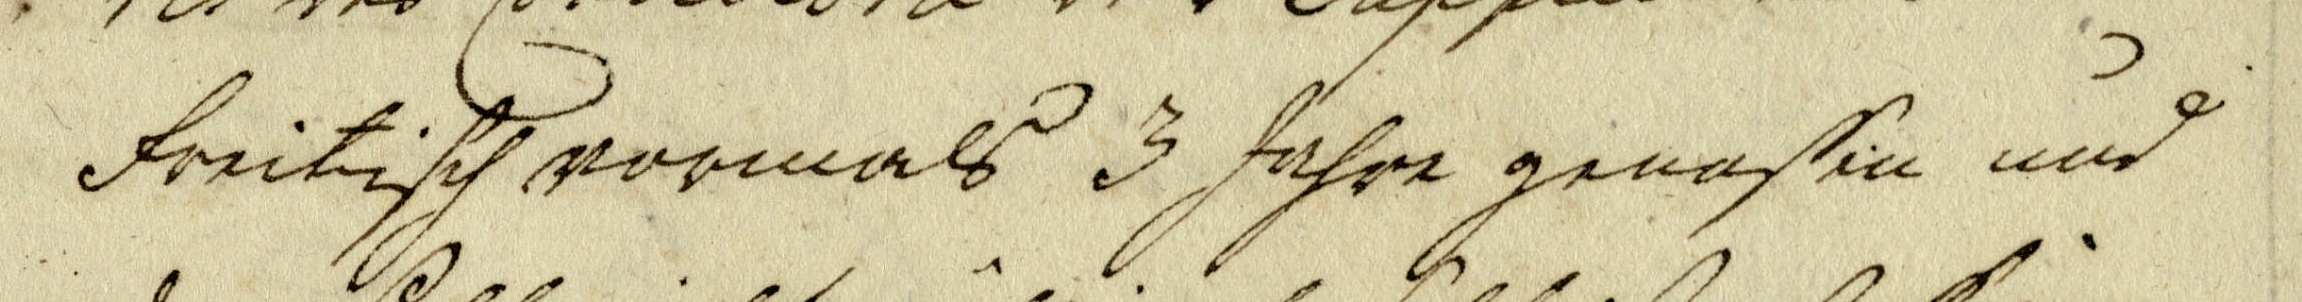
Freitisch vormals 3 Jahre genossen und
